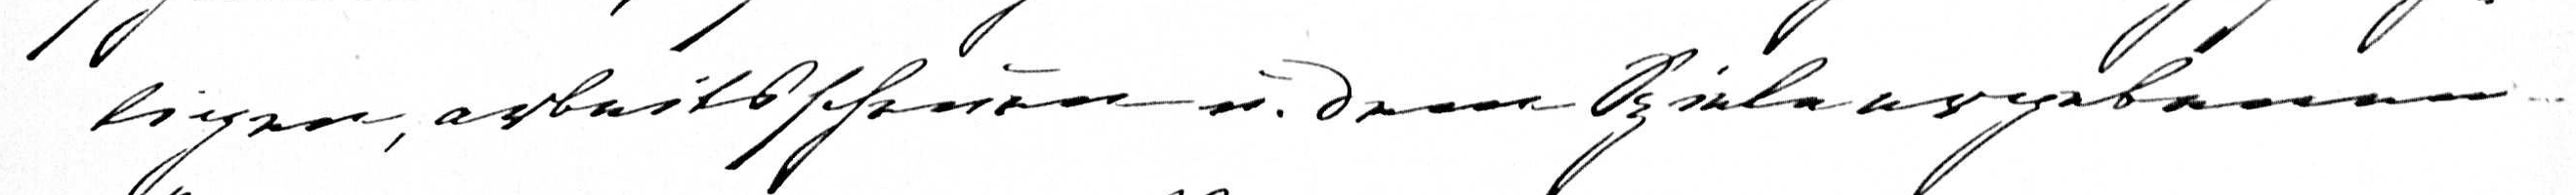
tigen, arbeitsscheuen u. dem Spiele ergebenen
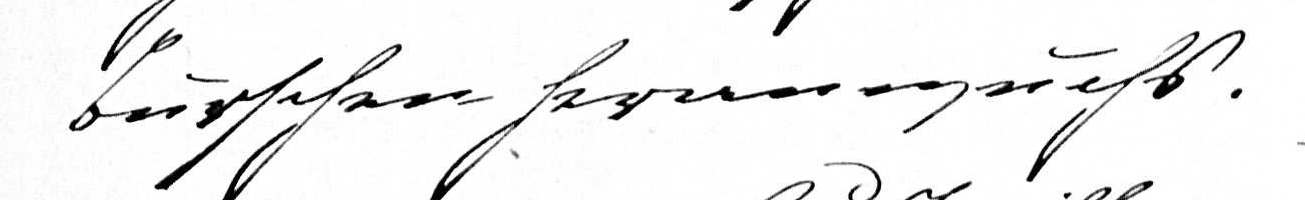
Burschen heranwuchs.
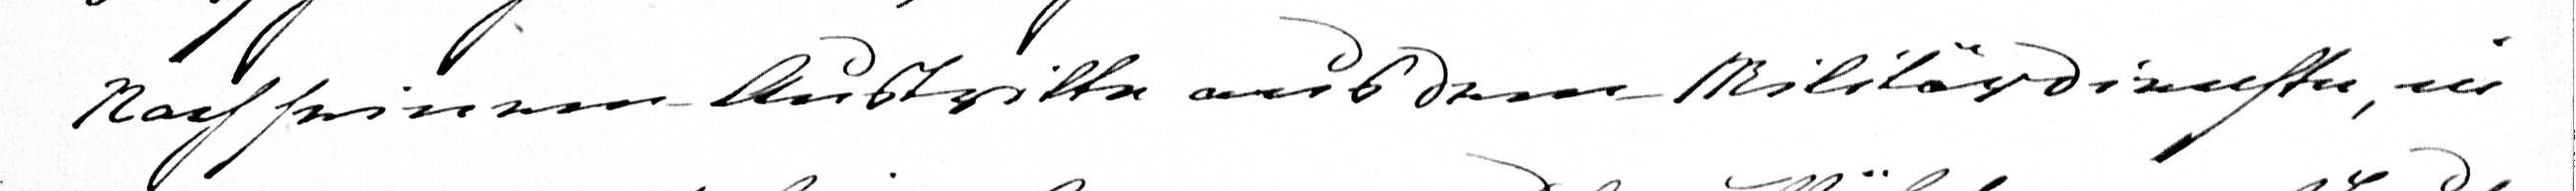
Nach seinem Austritte aus dem Militärdienste, in
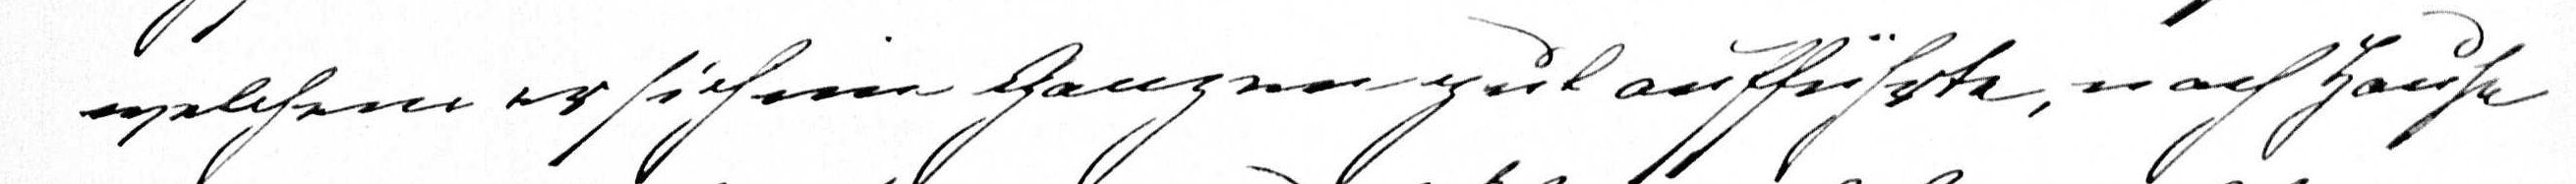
welchem er sich im Ganzen gut aufführte, nach Hause
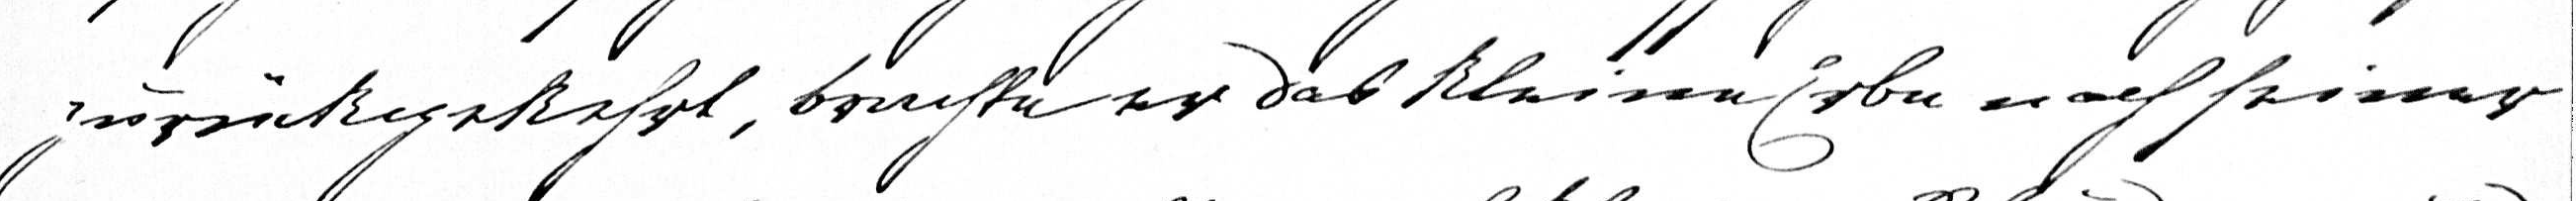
zurückgekehrt, brachte er das kleine Erbe nach seiner
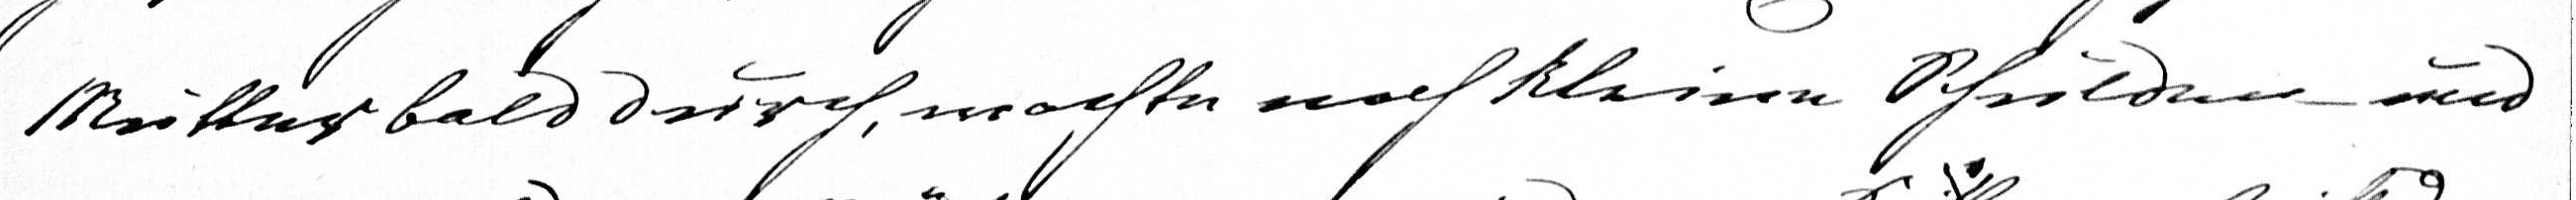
Mutter bald durch , machte noch kleine Schulden und
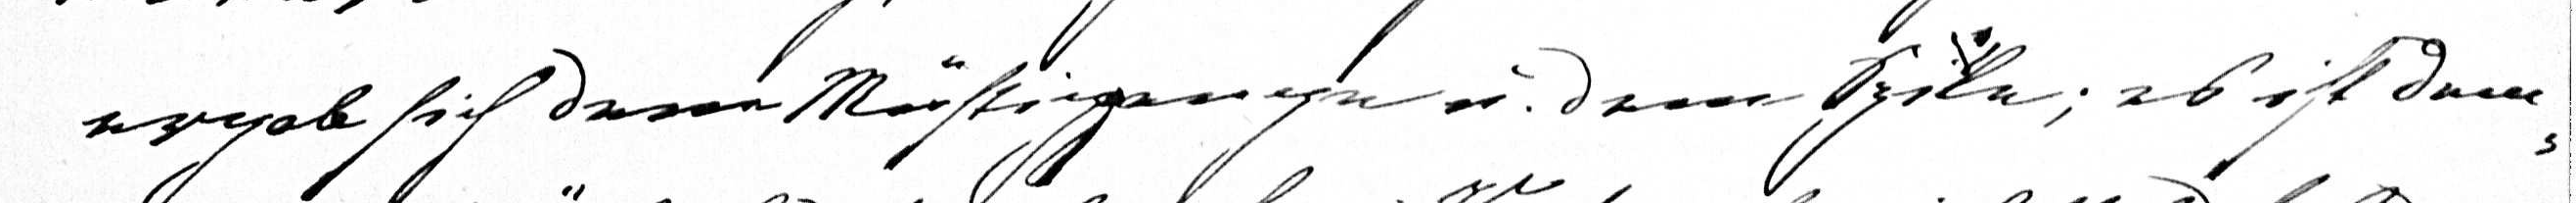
ergab sich dem Müßiggange u. dem Spiele; es ist dem¬
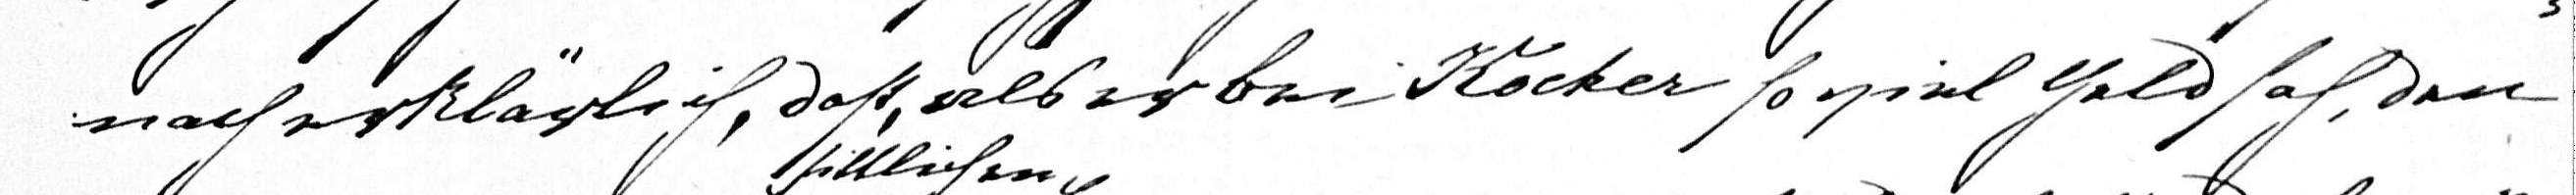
nach erklärlich, daß als er bei Kocher so viel Geld sah, den
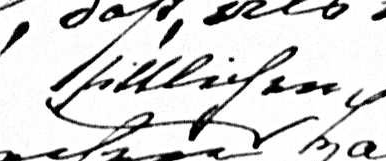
sittlichen
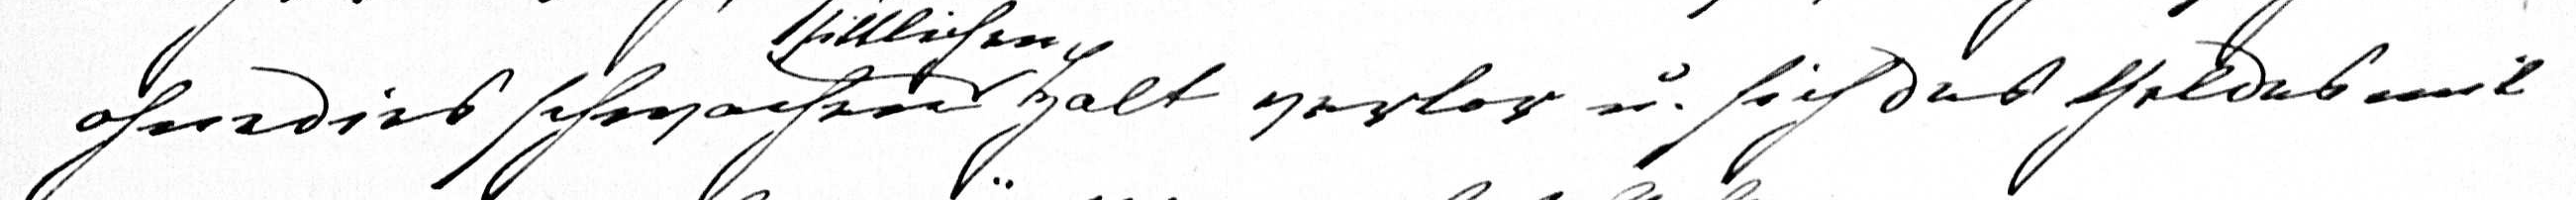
ohnedies schwachen Halt verlor u sich des Geldes mit
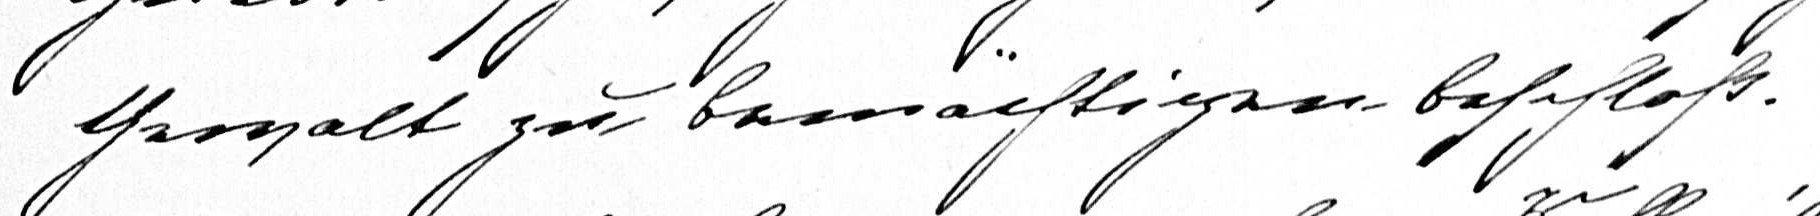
Gewalt zu bemächtigen beschloß.
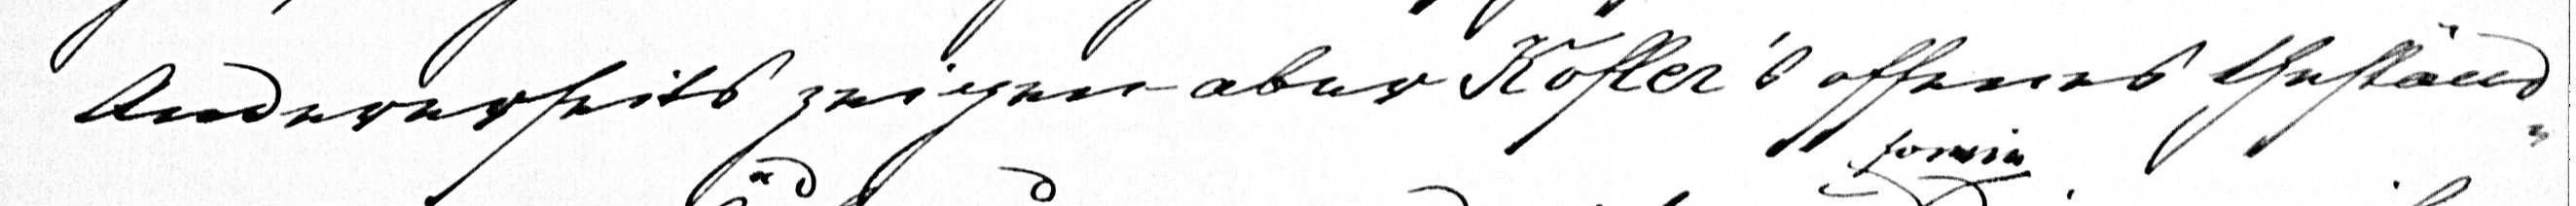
Andererseits zeigen aber Kofler’s offenes Geständ¬
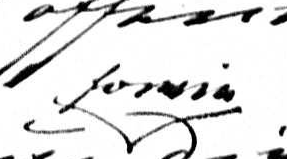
sowie
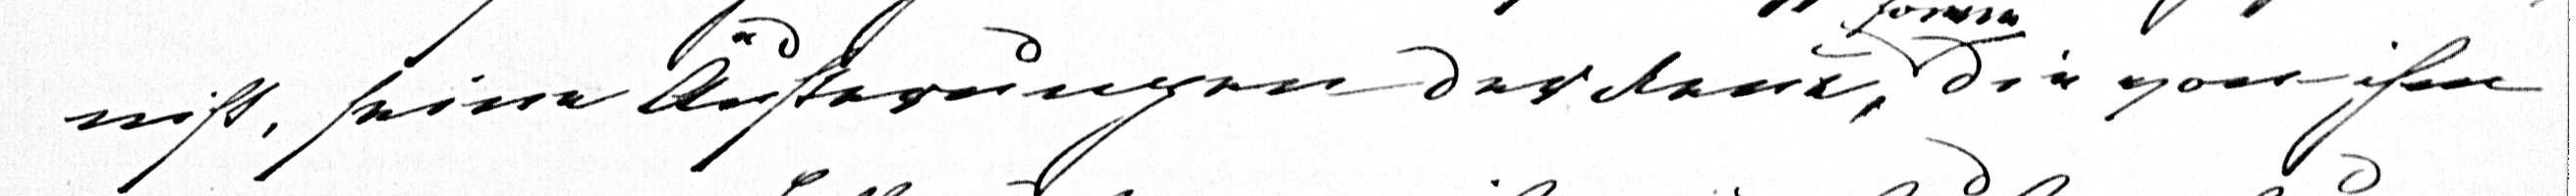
niß, seine Äußerungen der Dank, die von ihm
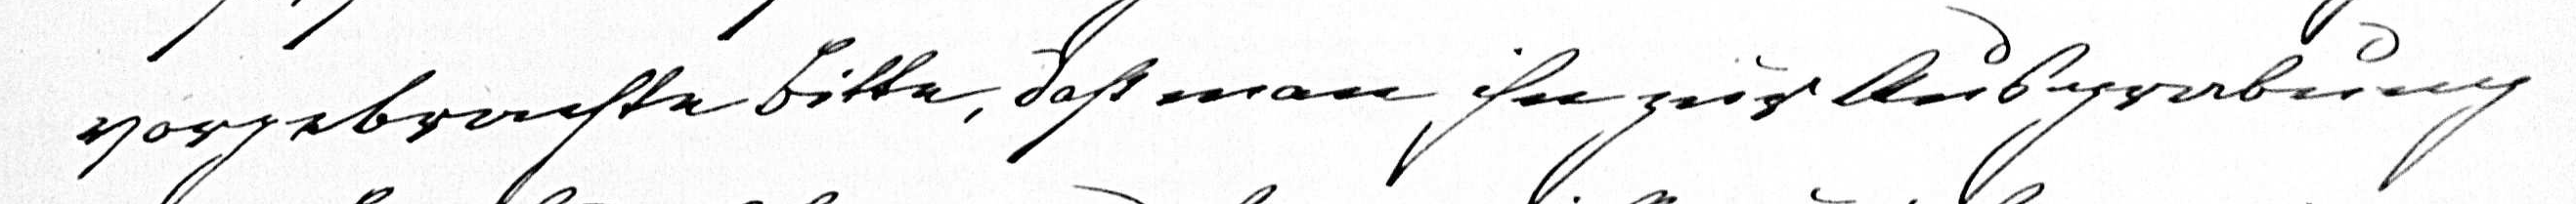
vorgebrachte Bitte, daß man ihn zur Ausgrabung
